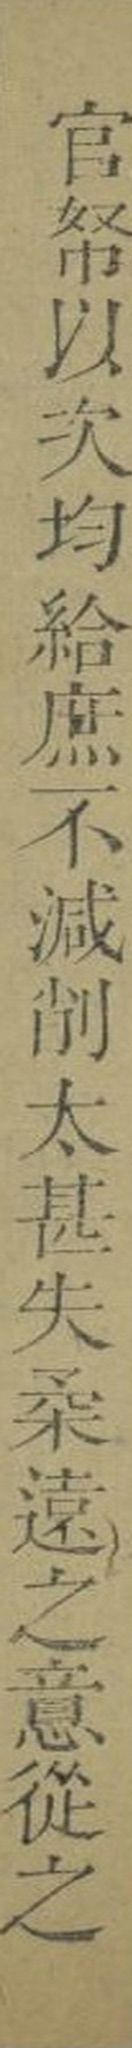官帑以次均給庶不減削太甚失柔遠之意従之
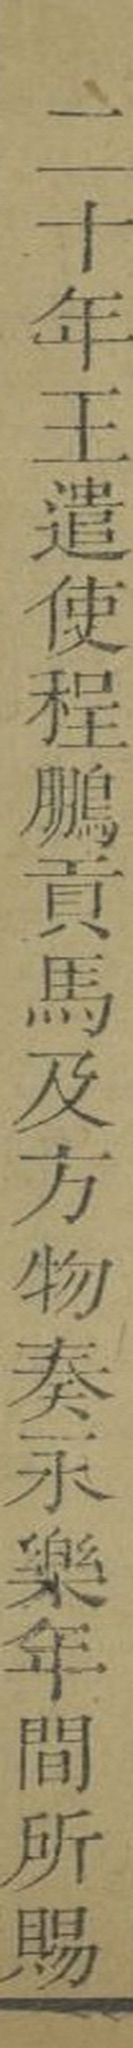二十年王遣使程鵬貢馬及方物奏永楽年間所賜
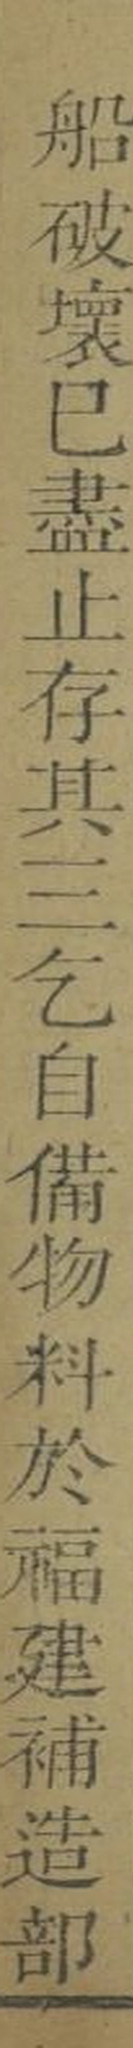船破壊巳尽止存其三乞自備物料於福建補造部

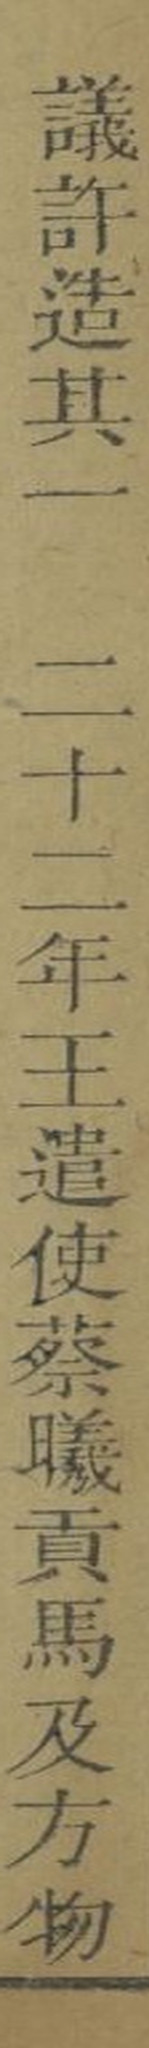義許造其一二十二年王遣使蔡䂀貢馬及方物
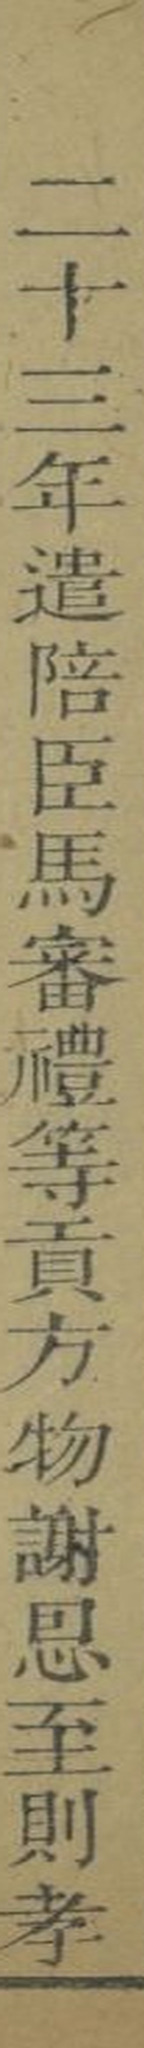二十三年遣陪臣馬審礼等貢方物謝恩至則孝
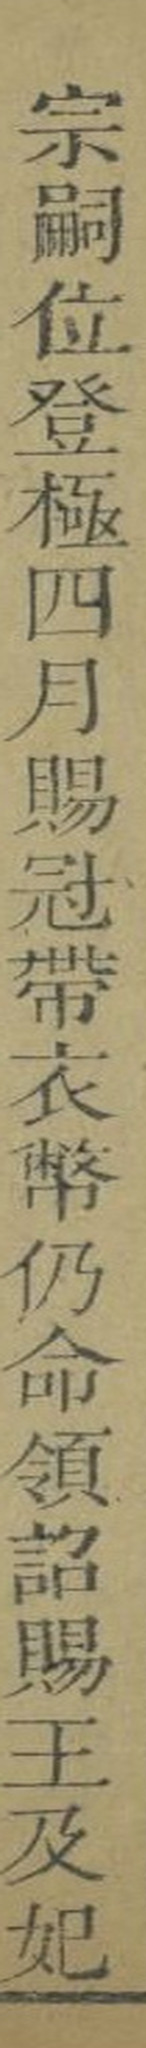宗嗣位登極四月賜冠帯衣幣仍命領詔賜王及妃
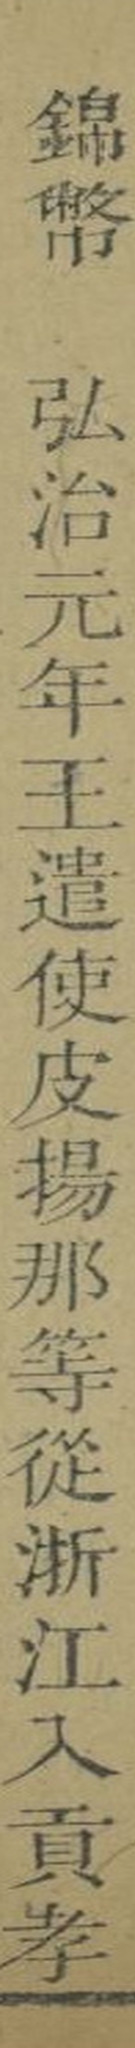錦幣弘治元年王遣使皮揚那等従浙江入貢孝
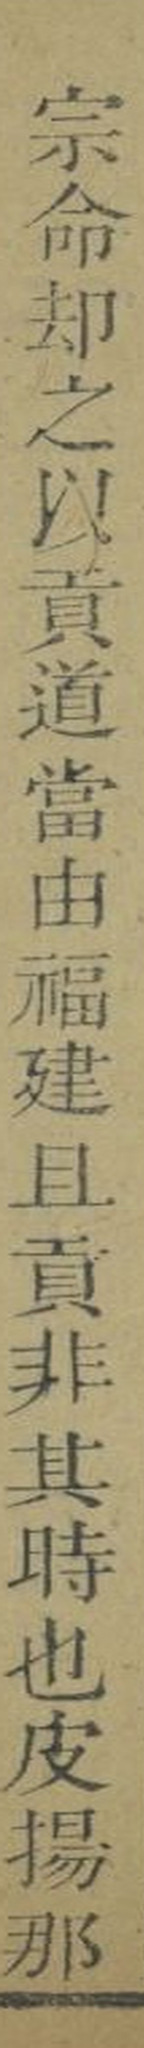宗命却之以貢道当由福建且貢非其時也皮揚那
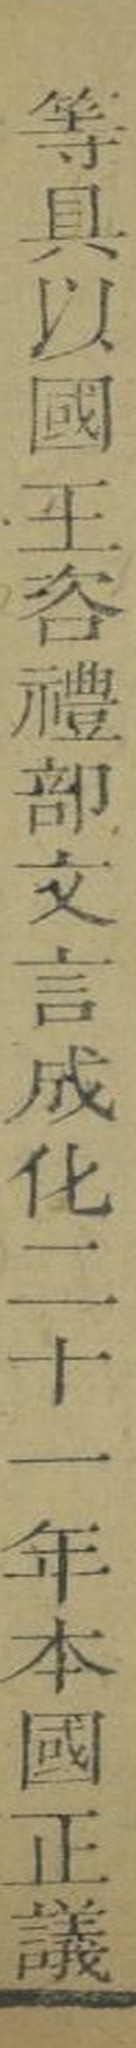等具以国王咨礼部文言成化二十一年本国正議
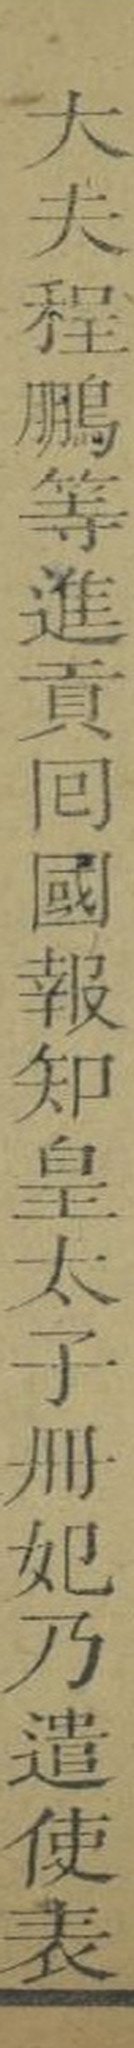大夫程鵬等進貢回国報知皇太子冊妃乃遣使表
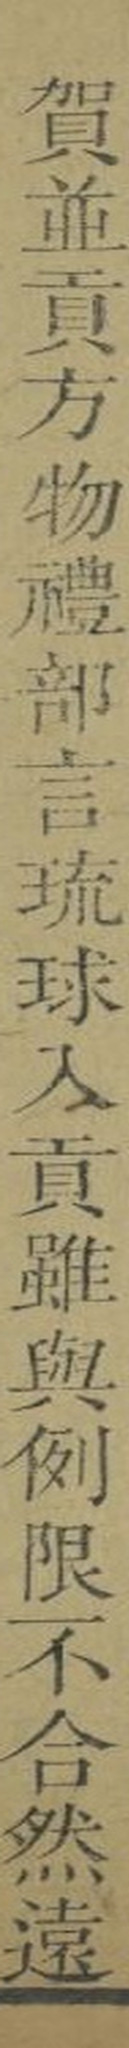賀並貢方物礼部言琉球入貢雖与例限不合然遠
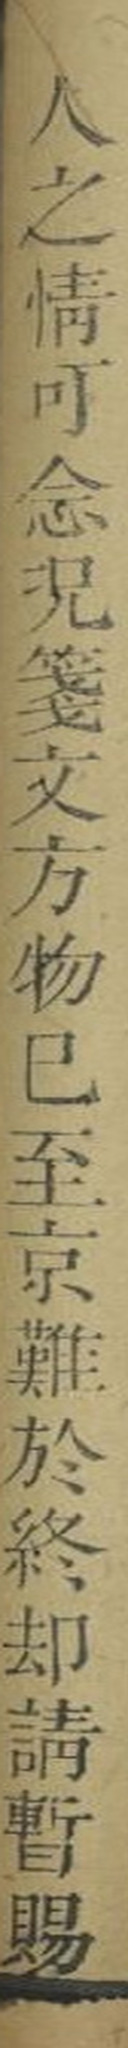人之情可念況箋文方物巳至京難於終却請暫賜
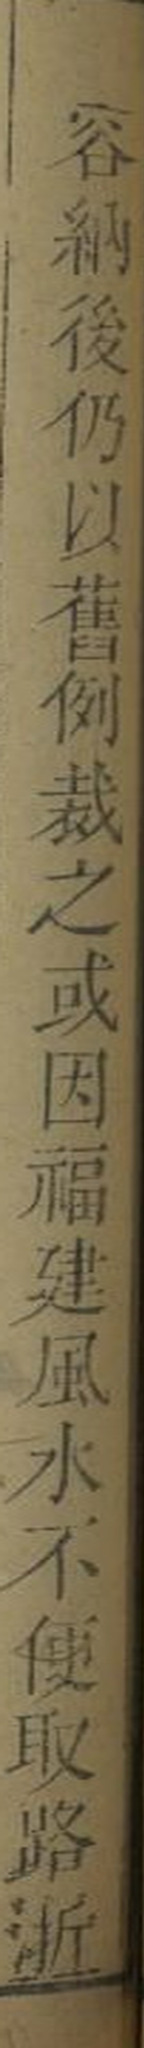容納後仍以旧例裁之或因福建風水不便取路浙
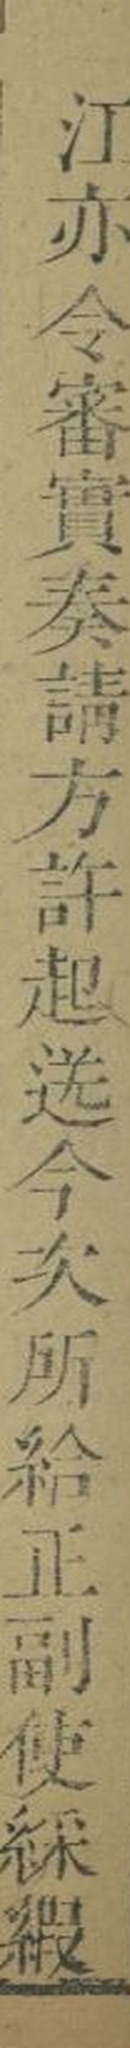江亦令審実奏請方許起送今次所給正副使綵緞
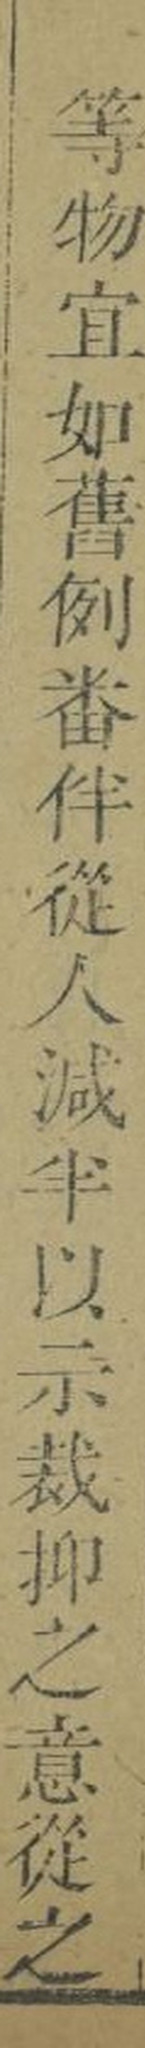等物宜如旧例畨伴従人減半以示裁抑之意従之
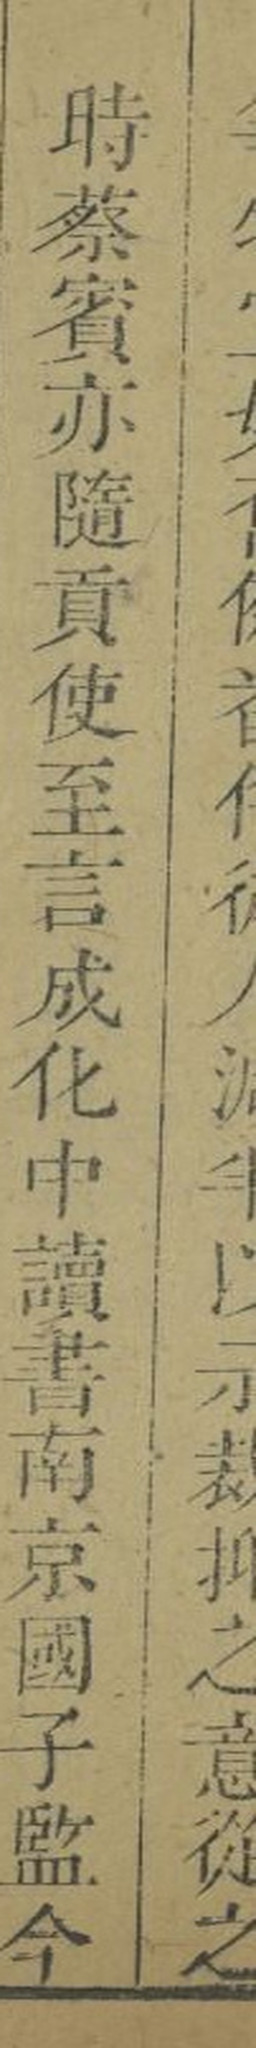時蔡賓亦随貢使至言成化中読書南京国子監今
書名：中山伝信録 巻三
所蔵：University of the Ryukyus Library
